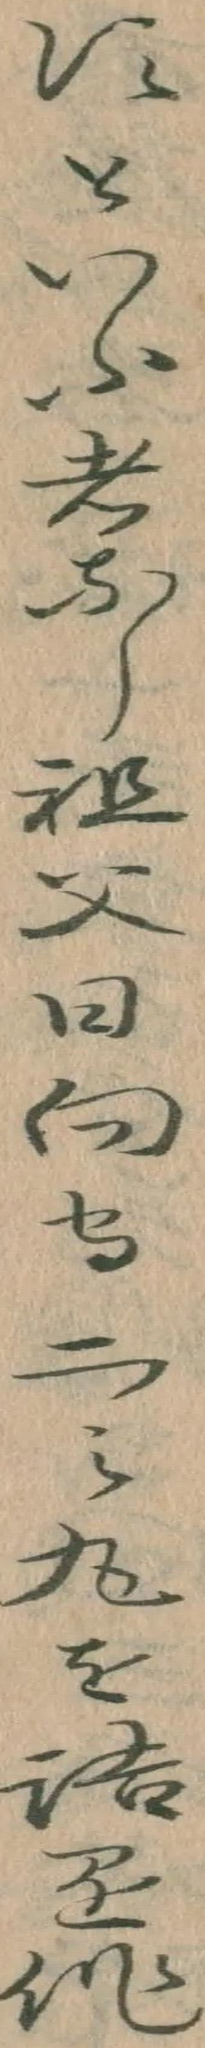須といふ者なし祖父日向守二之丸を詰懸作
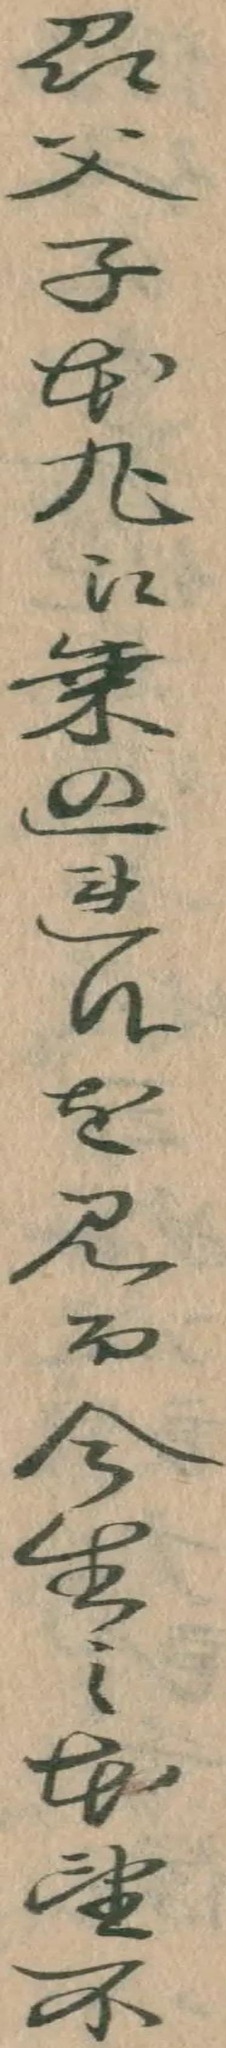州父子本丸江乗込連候を見而今生之本望不
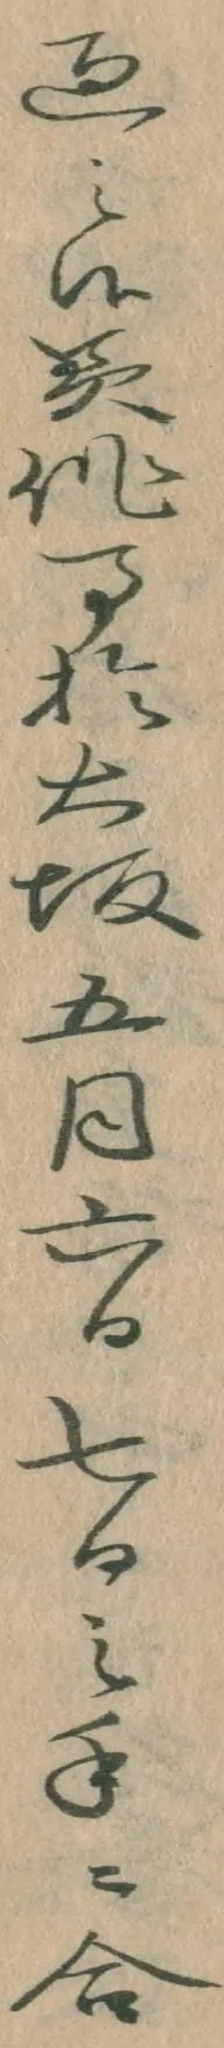過之候美作事於大坂五月六日七日之手に合
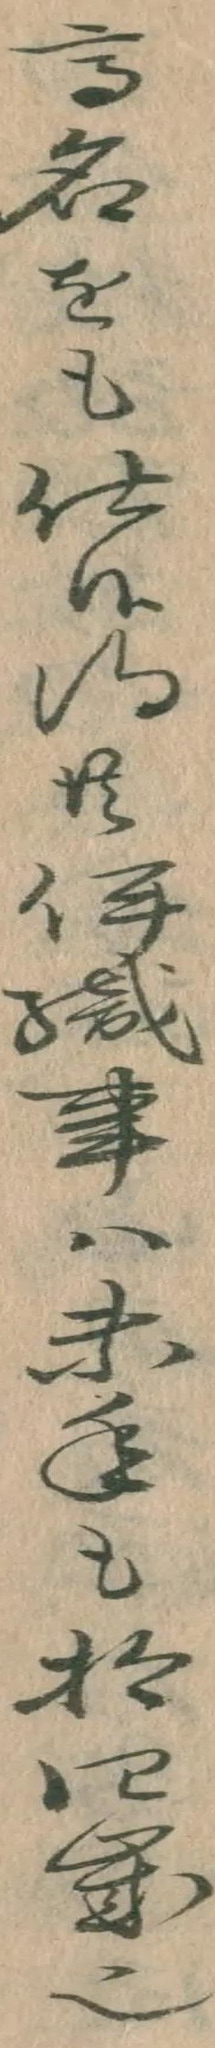高名をも仕候得共伊織事は未手も拾四歳也
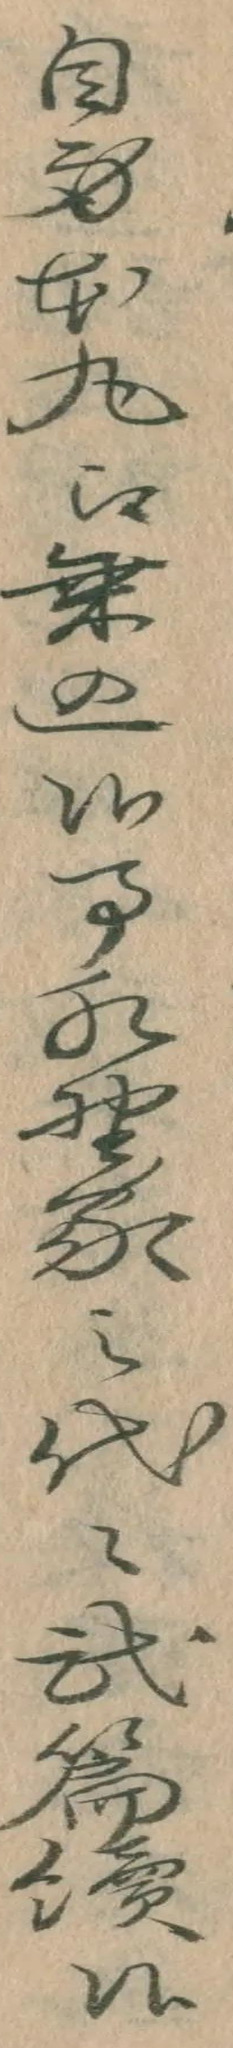自身本丸江乗込候事水野家之代に武篇続候
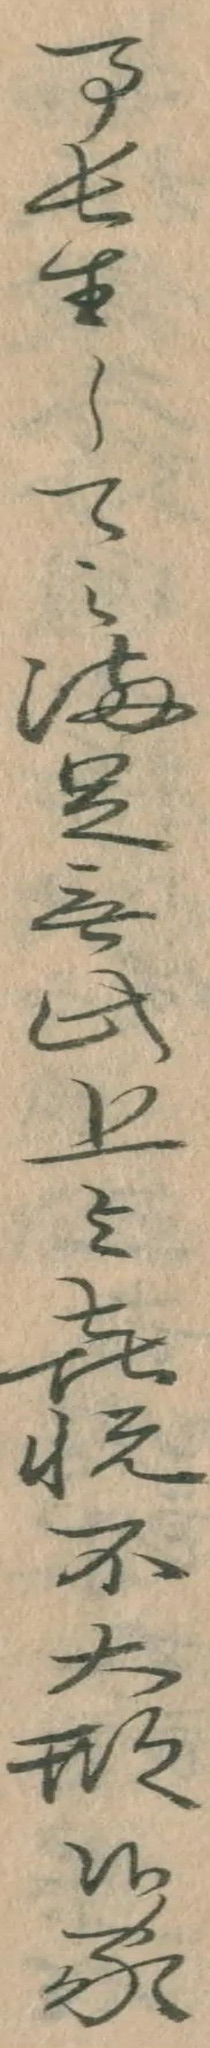事長生して之満足無此上与喜悦不大形候家
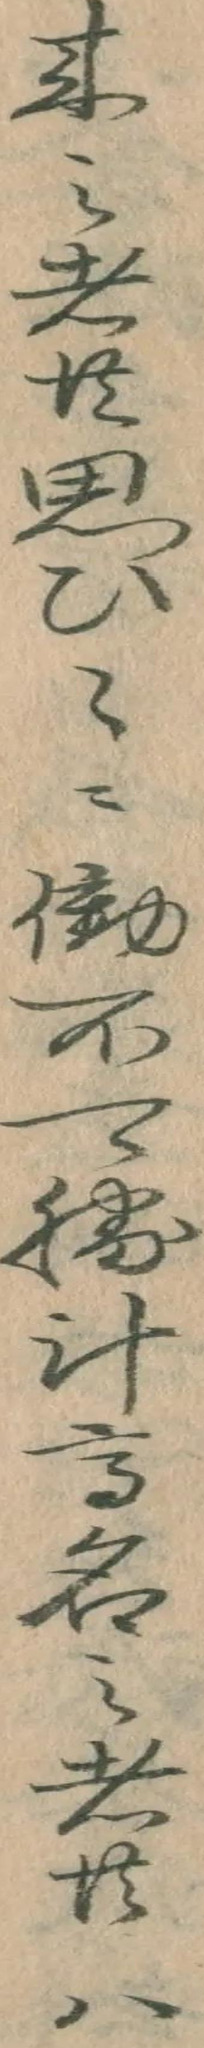来之者共思ひ〱に働不可勝斗高名之者共は
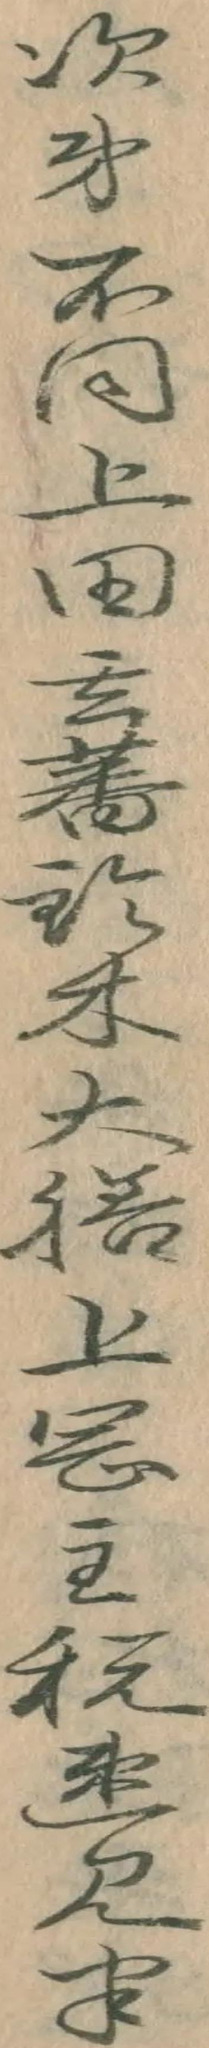次第不同上田玄蕃鈴木大膳上岡主税速見半

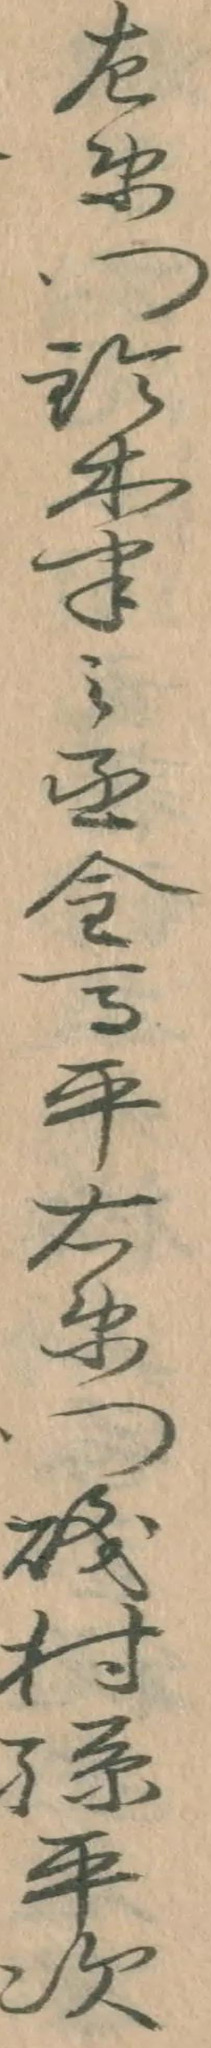左衛門鈴木半之丞金馬平右衛門磯村孫平次
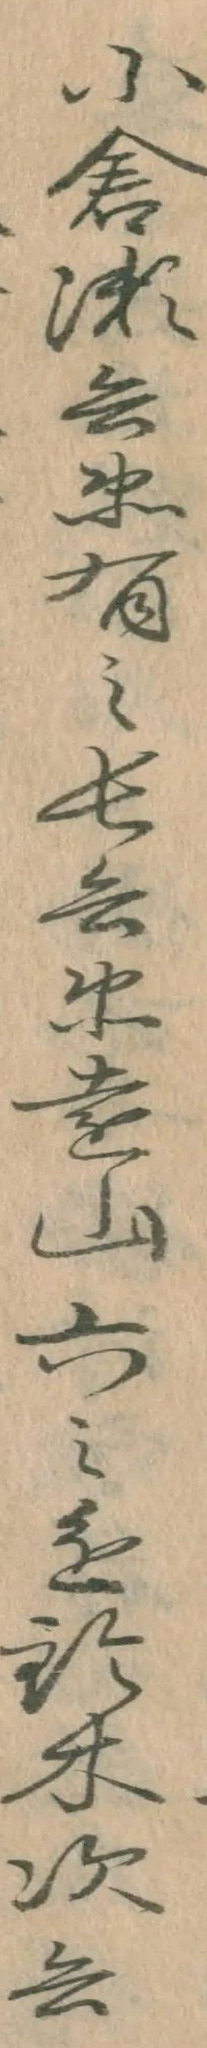小倉瀬兵衛有之長兵衛遠山六之進鈴木次兵
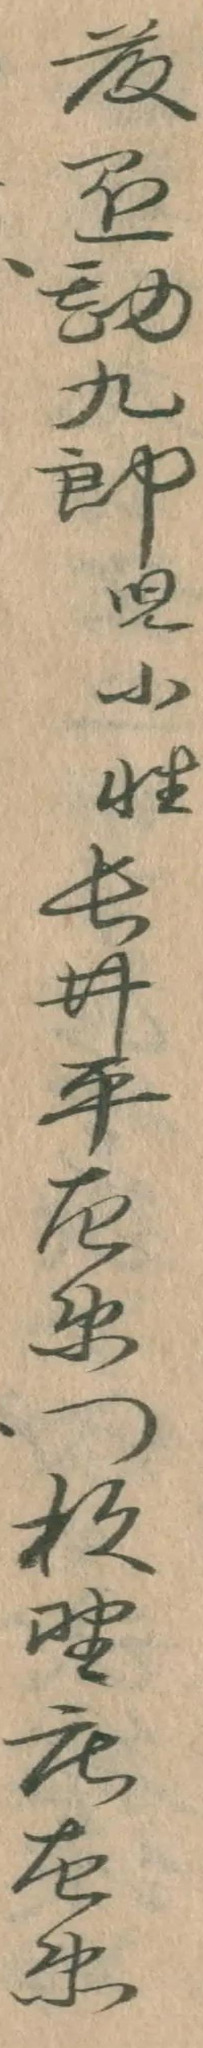藤懸勘九郎児小姓長井平左衛門杉野庄左衛
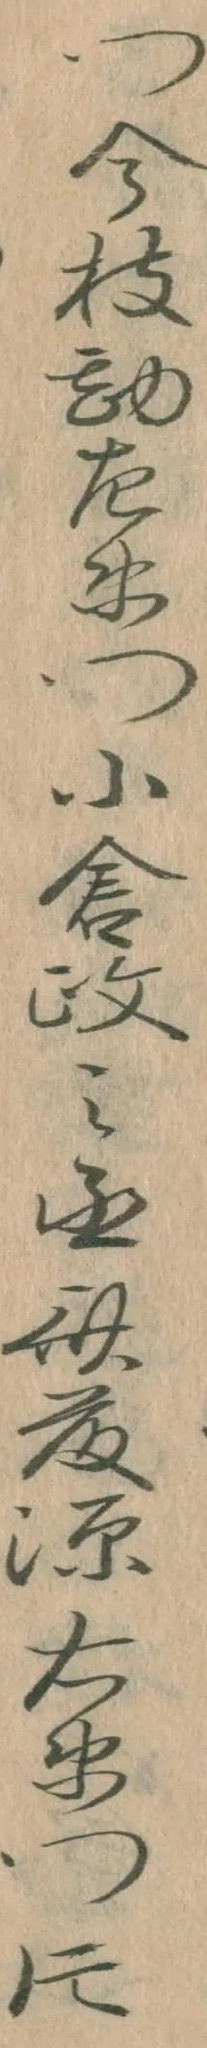門今枝勘左衛門小倉政之丞斎藤源右衛門片
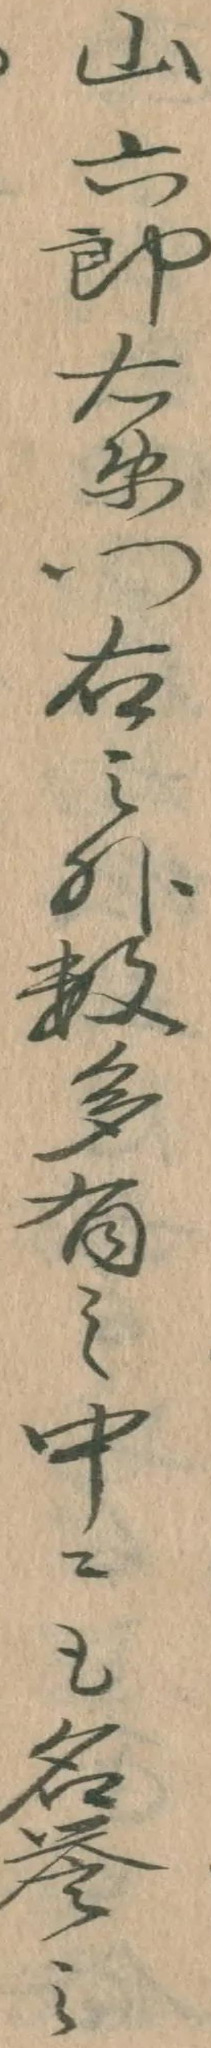山六郎右衛門右之外数多有之中にも名誉之
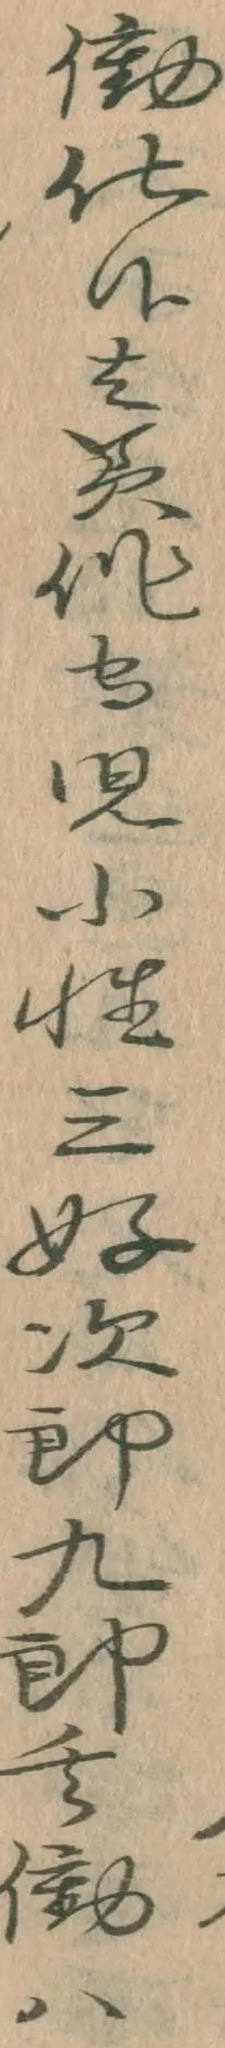働仕候者美作守児小姓三好次郎九郎其働は
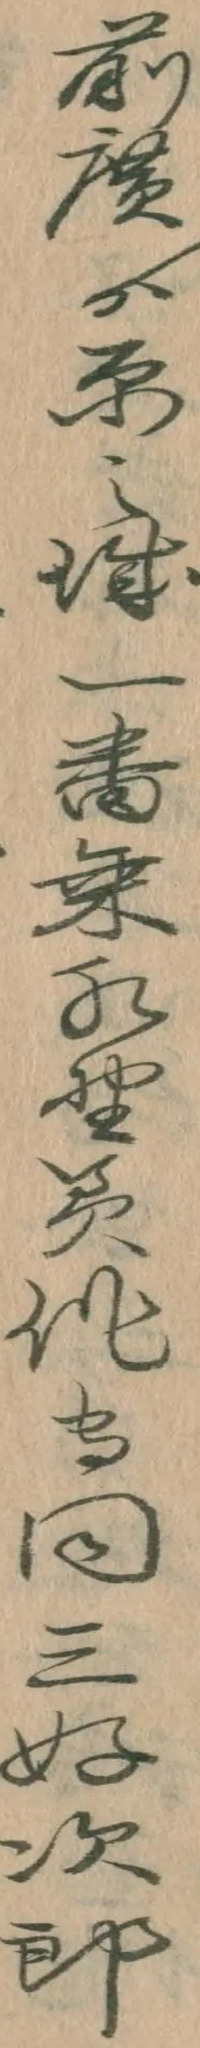前広ゟ原之城一番乗水野美作守同三好次郎
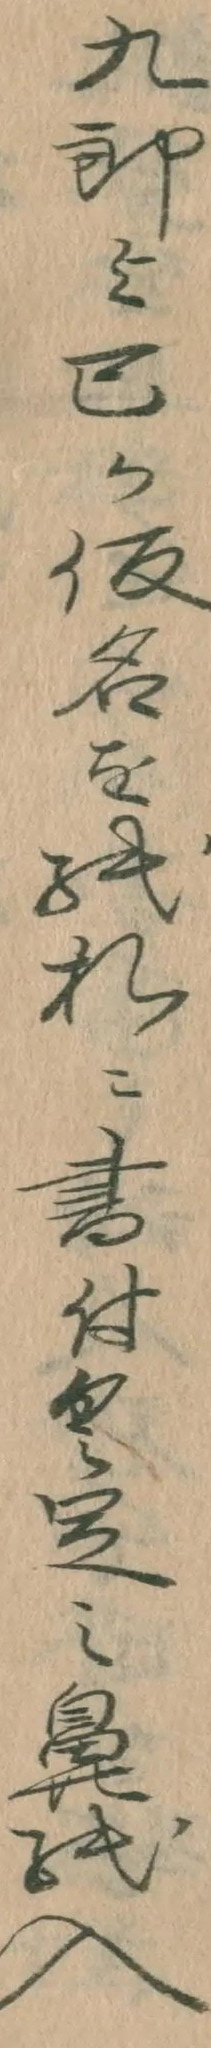九郎与已か仮名を紙札に書付具足之鼻紙入
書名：切支丹御退治記 49巻. [7]
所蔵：国立国会図書館 National Diet Library, JAPAN
